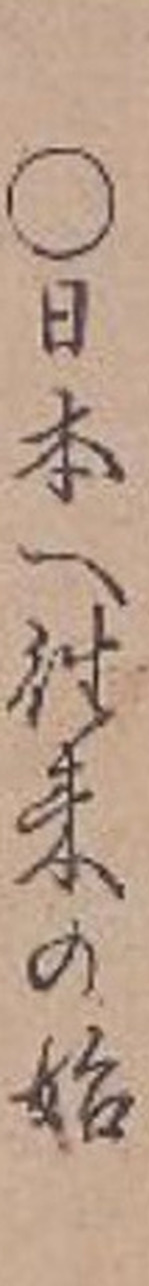〇日本へ往来の始
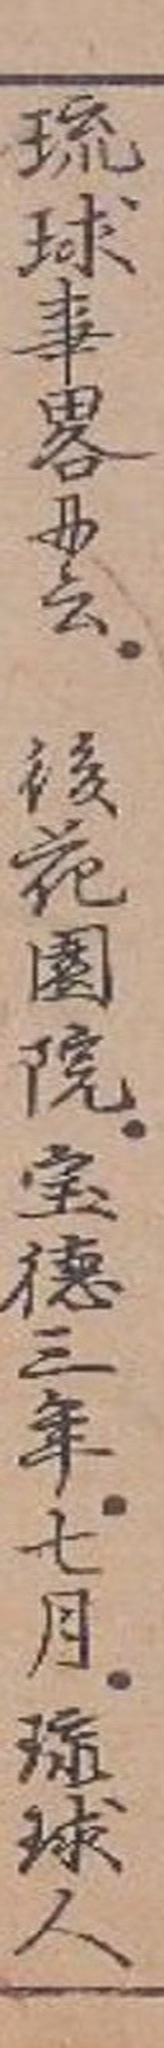琉球事略に云•後花園院•宝徳三年•七月•琉球人
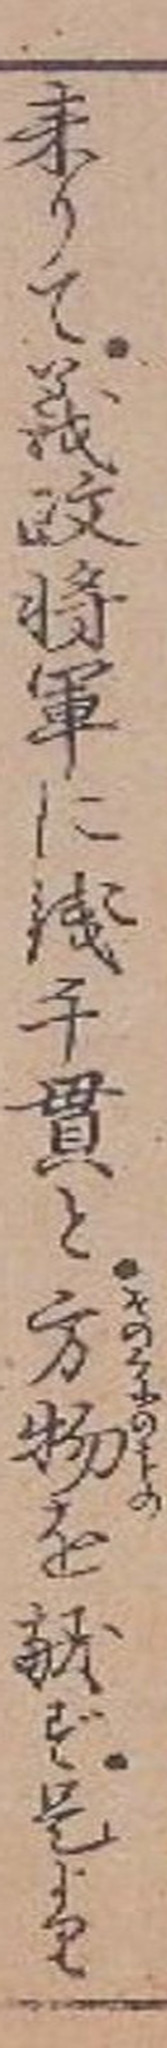来りて•義政将軍に銭千貫と•方物を献ず•是より
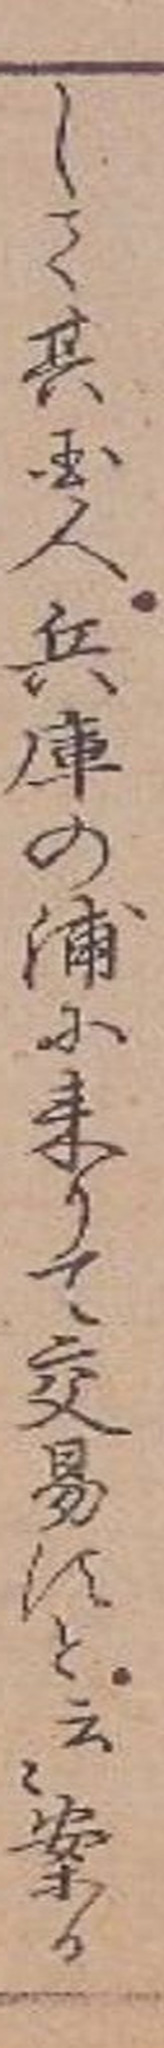して其国人•兵庫の浦に来りて交易すと•云々案る
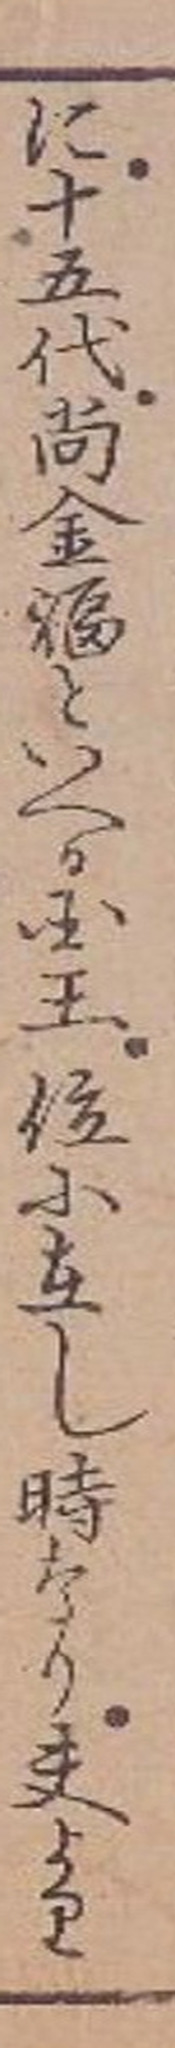に•十五代•尚金福といへる国王•位に在し時なり•夫より
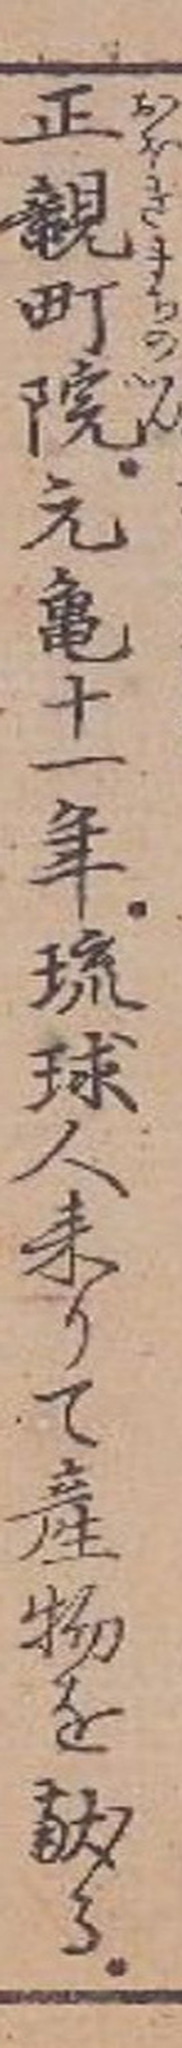正親町院•元亀十一年•琉球人来りて産物を献る•
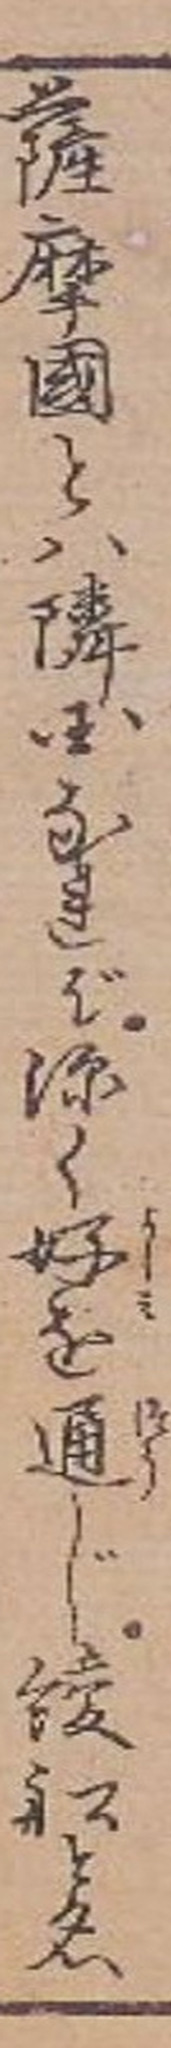薩摩国とは隣国なれば•深く好を通じ•綾船と名
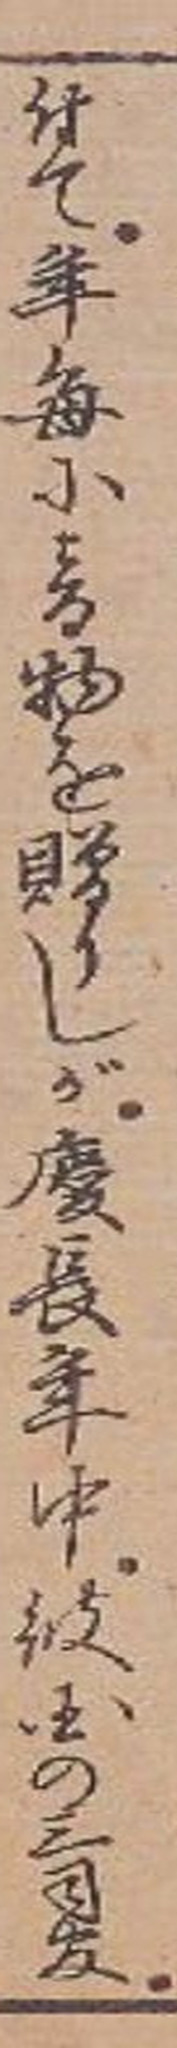付て•年毎に音物を贈りしが•慶長年中•彼国の三司官•
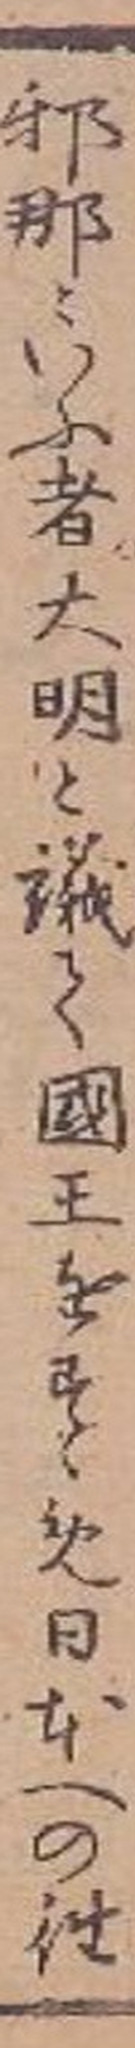邪那といふ者。大明と議て国王をすゝめ。日本への往
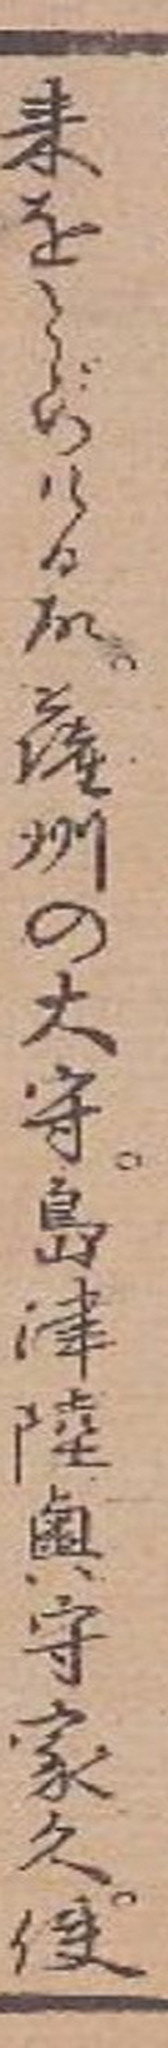来をとゞめける故。薩州の大守。島津陸奥守家久。使
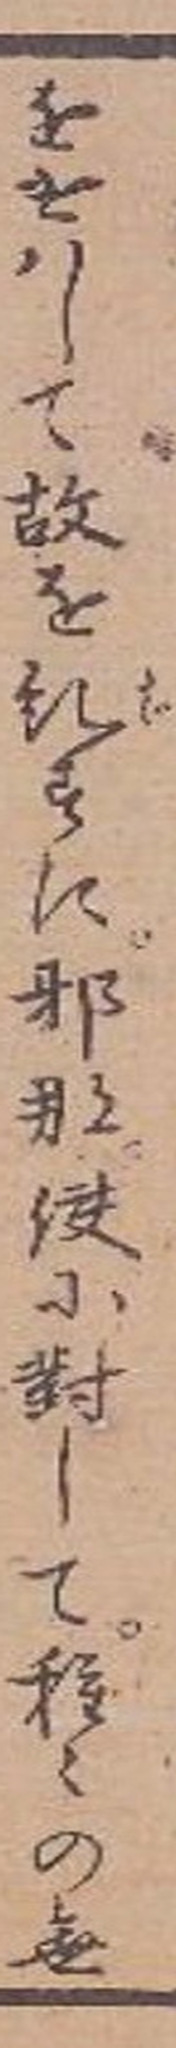を遣はして故を糺すに。邪那。使に対して。種々の無
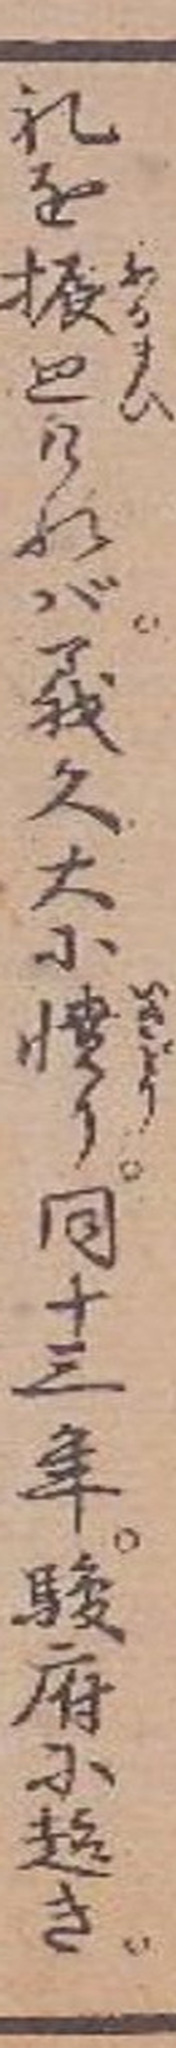礼を振廻ければ。義久大に憤り。同十三年。駿府に趣き。
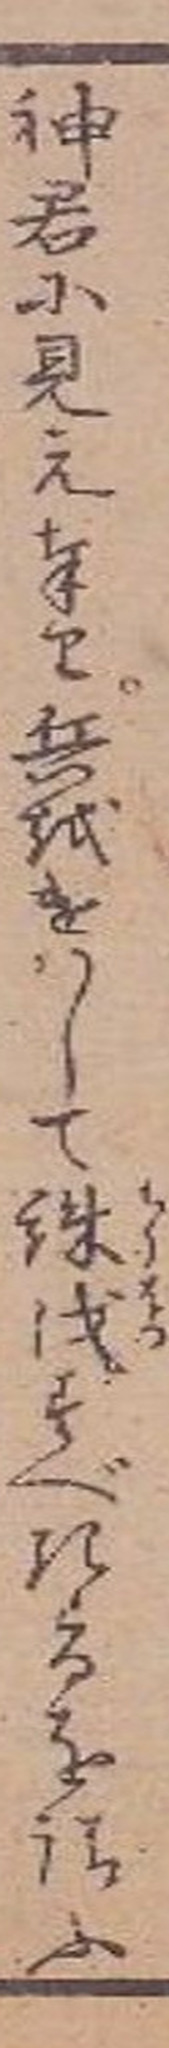神君に見え奉て。兵を遣はして誅罰すべき旨を請ふ
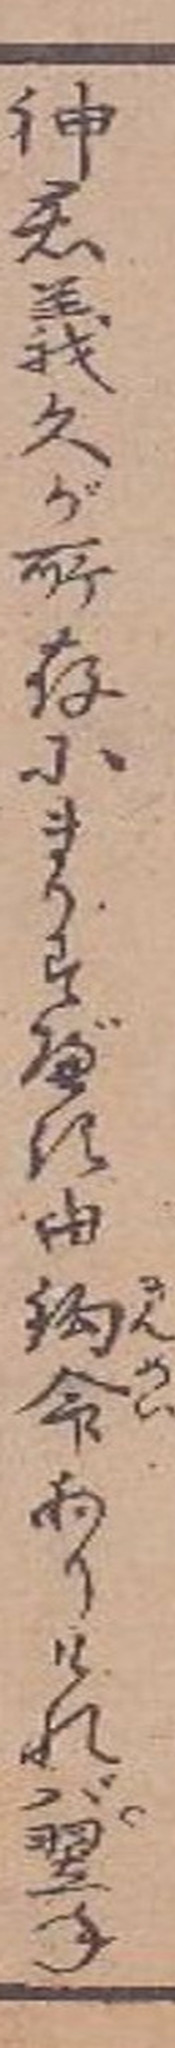神君義久が所存にまかすべき由鈎命ありければ。翌年
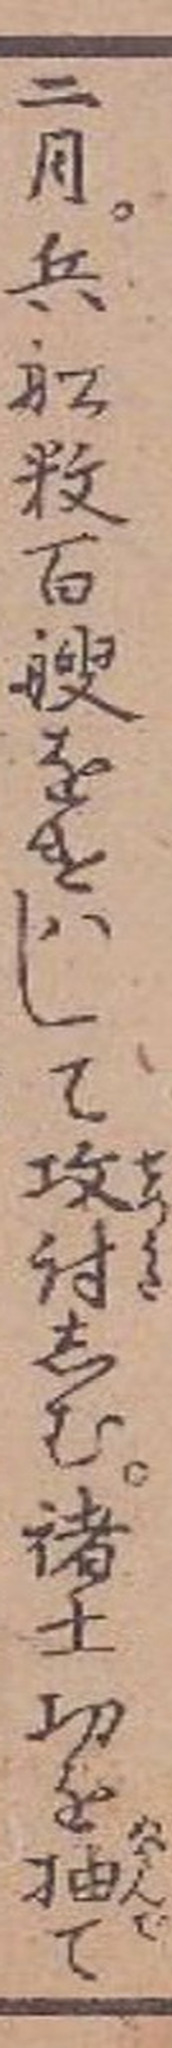二月。兵船数百艘遣はして攻討しむ。諸士功を抽て
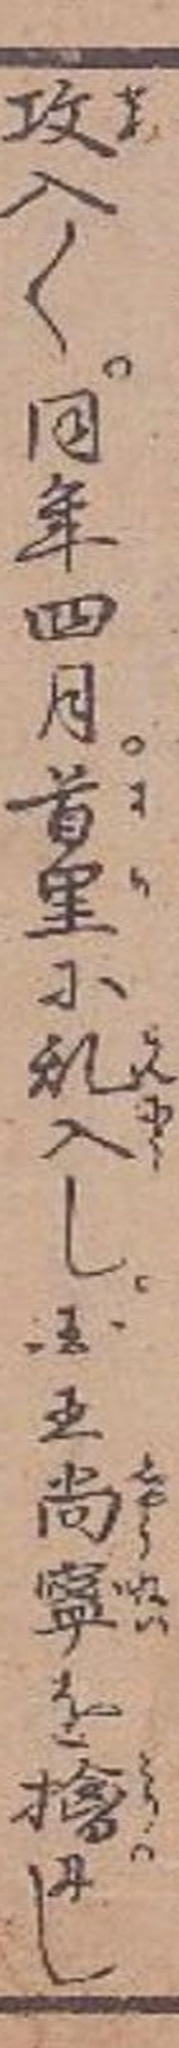攻入〳〵。同年四月。首里に乱入し。国王尚寧を擒にし
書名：琉球談
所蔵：University of the Ryukyus Library
